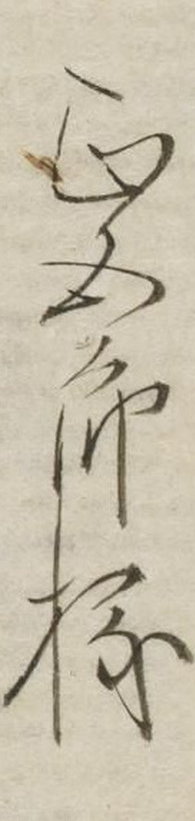正五郎様
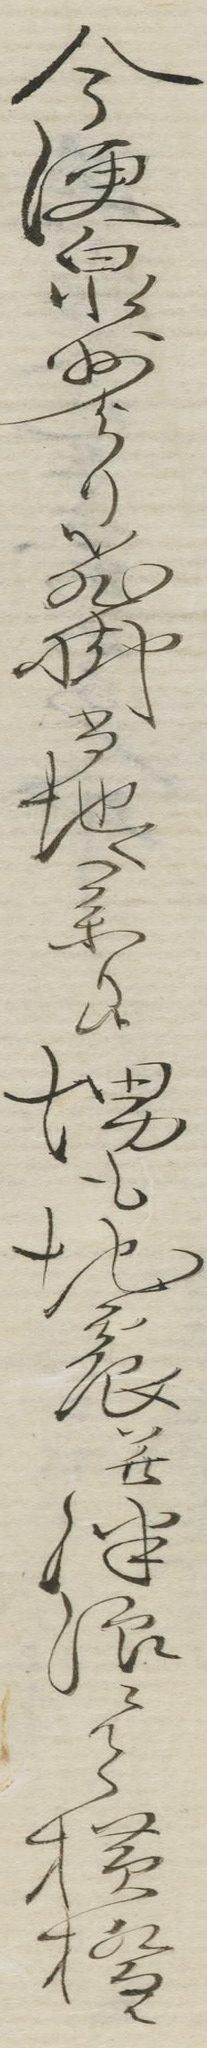今便泉州より飛脚当地へ参り候堺も地震并津浪ニて横橋ニ
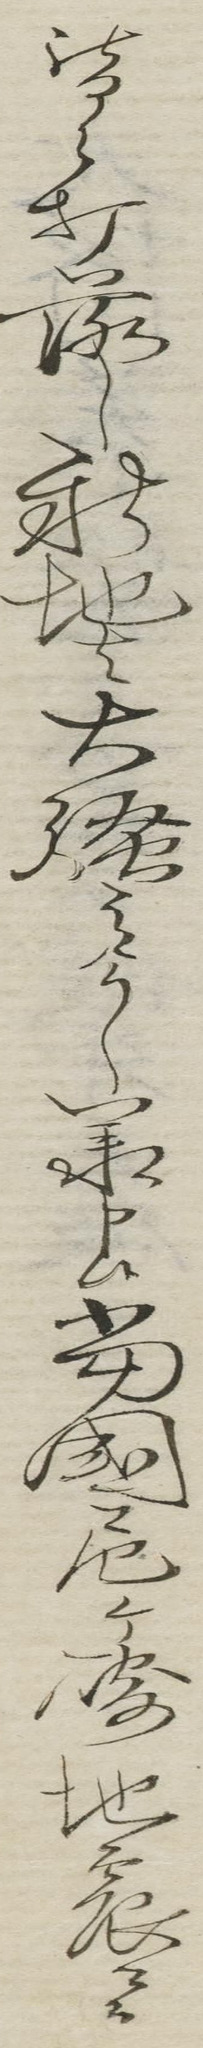皆〻打落し新地は大騒之よし承申候当国尼ケ崎地震ニ而
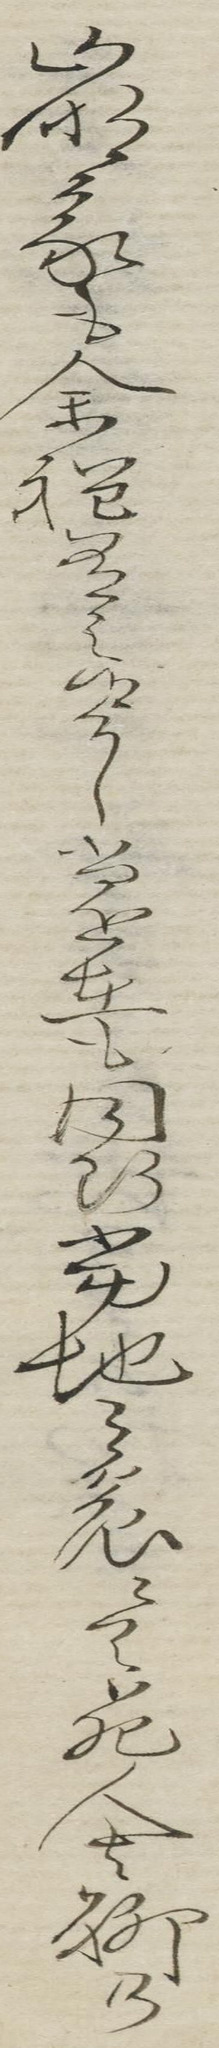崩家も余程有之候よし当近在も同断当地〻震ニて死人は聊の
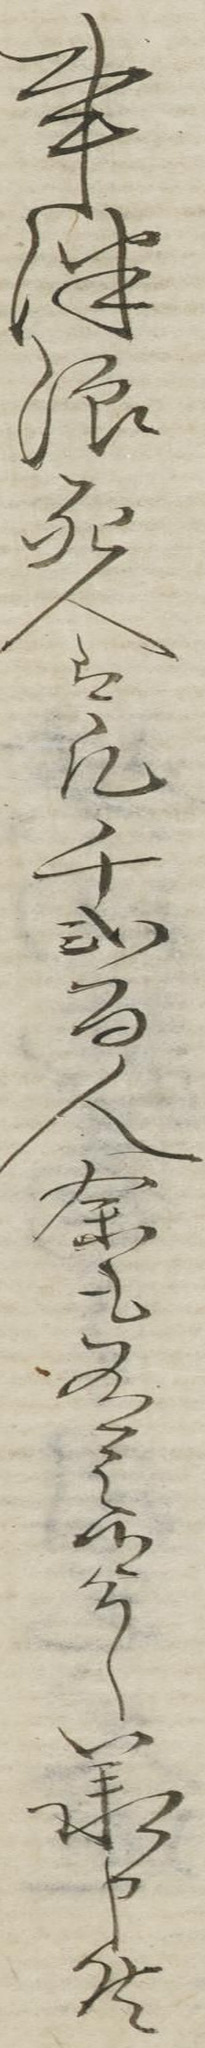事津浪死人は凡千弐百人余も有之候よし承申候

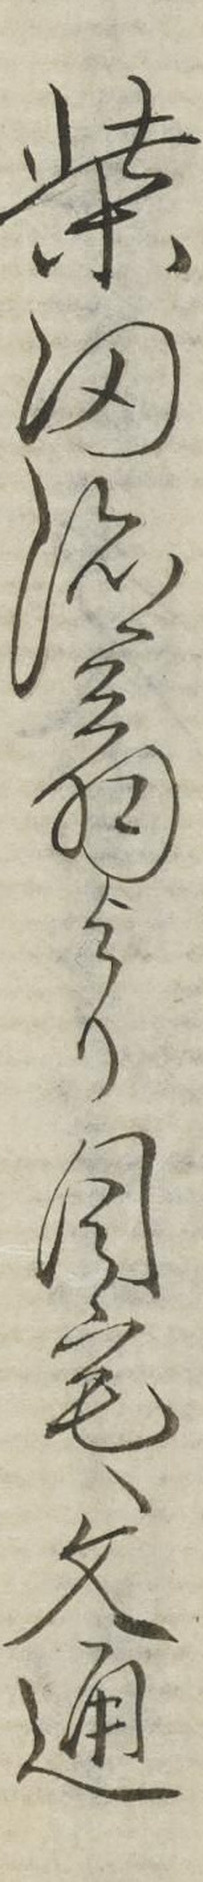柴田徳翁より自宅へ文通
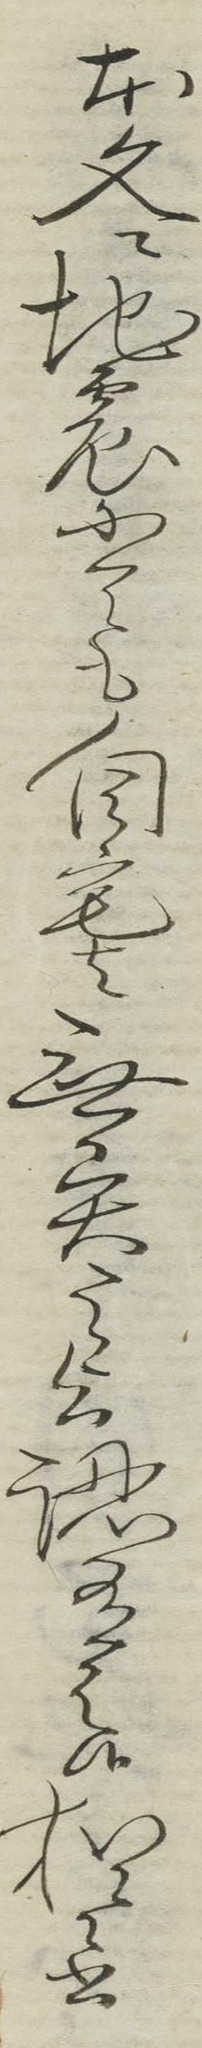本文ニ地震にても自宅は無異之旨認有之候猶〻書
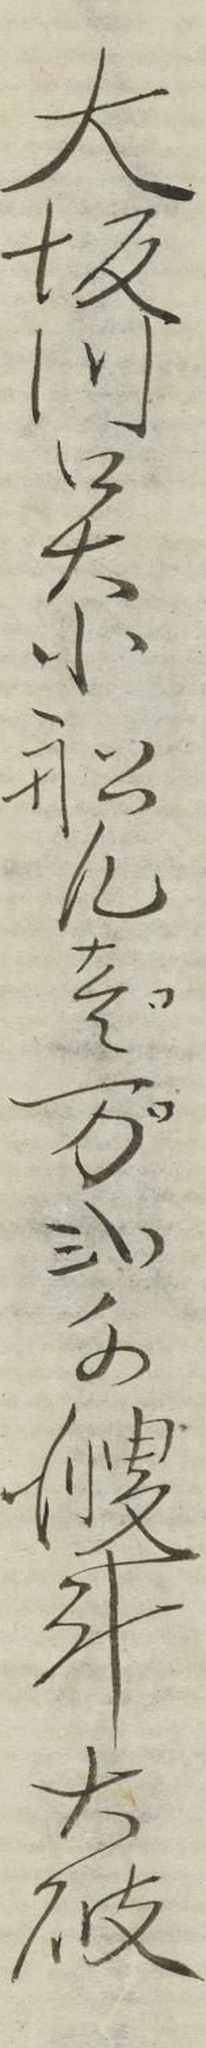大坂川口大小船凡壱万弐千艘計大破
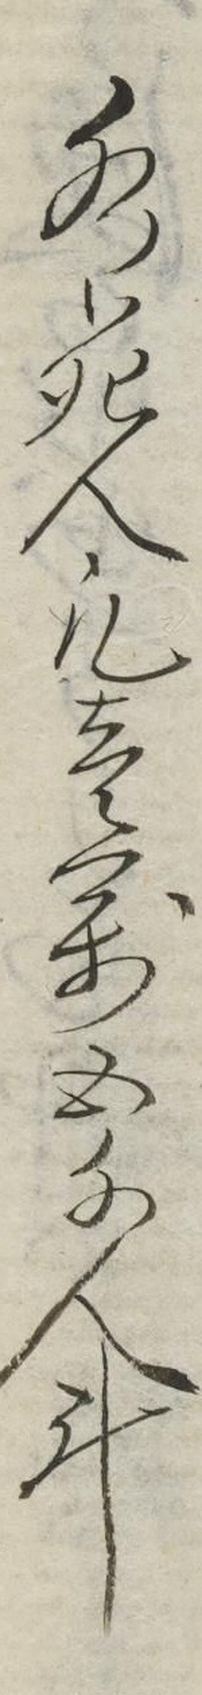水死人凡壱萬五千人計
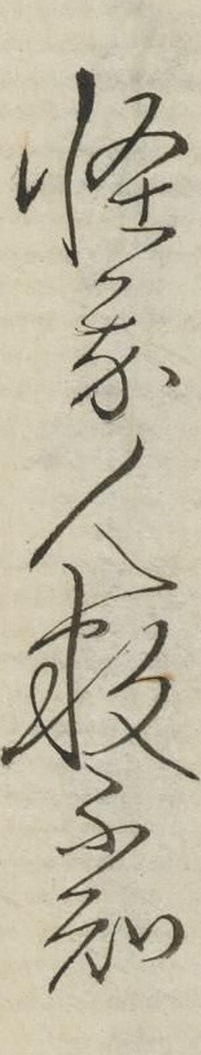怪我人数不知
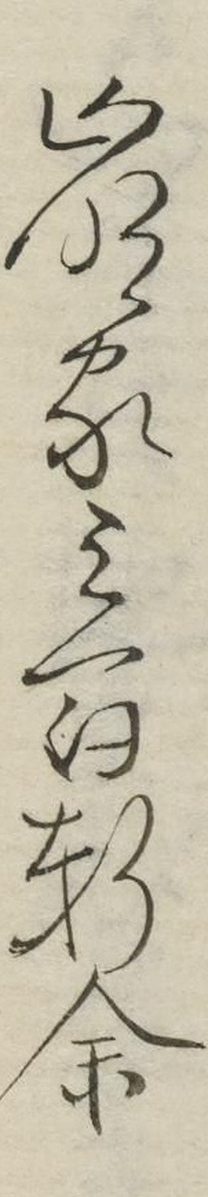崩家三百軒余
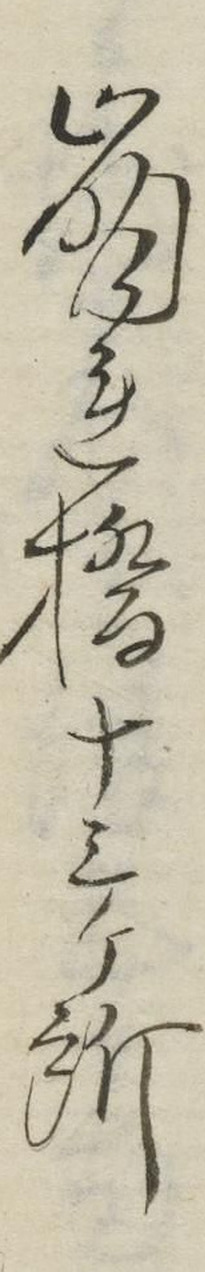崩れ橋十三ケ所
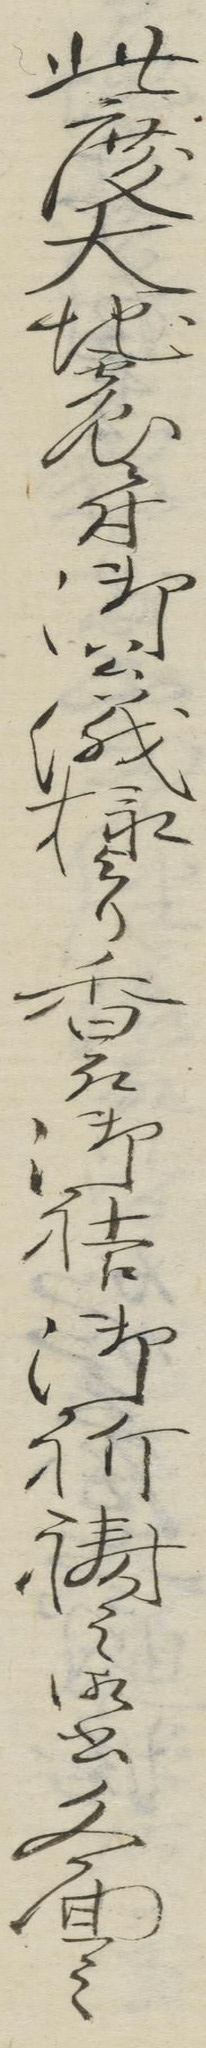此度大地震ニ付御公儀様より香取御社江御祈祷之御書文面之
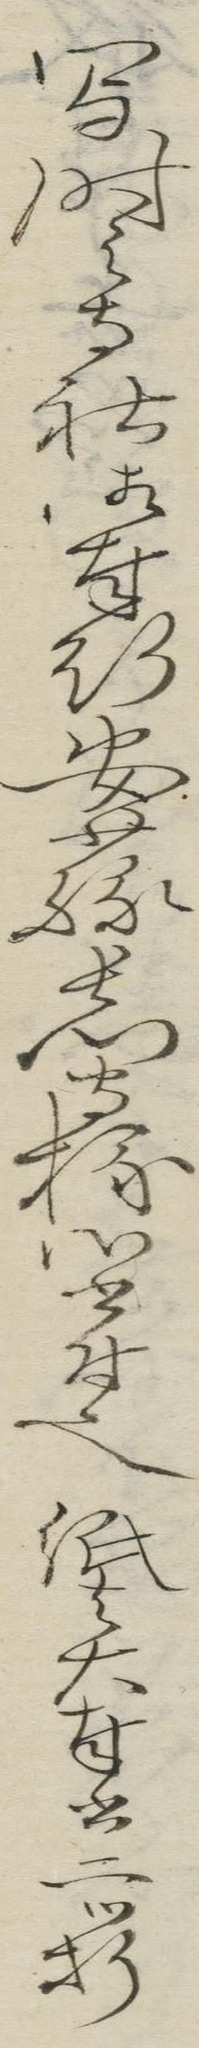写時之寺社御奉行安藤長門守様御書付也紙は大奉書二ツ折
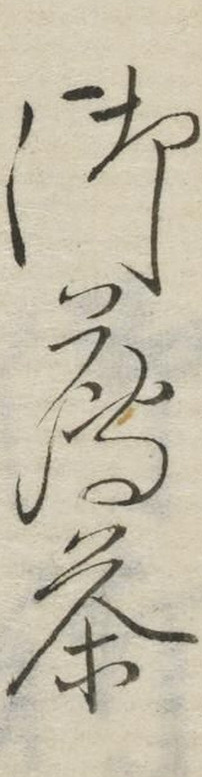御薄茶
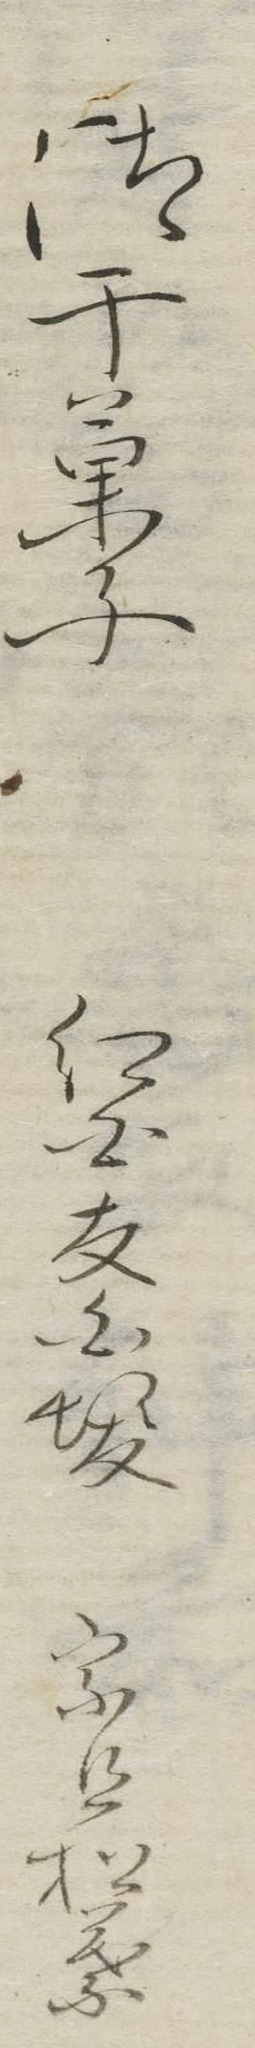御干菓子紅白共白髪宗旦松葉
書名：大地震實録
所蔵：東京大学地震研究所図書室 Earthquake Research Institute Library, The University of Tokyo, JAPAN
